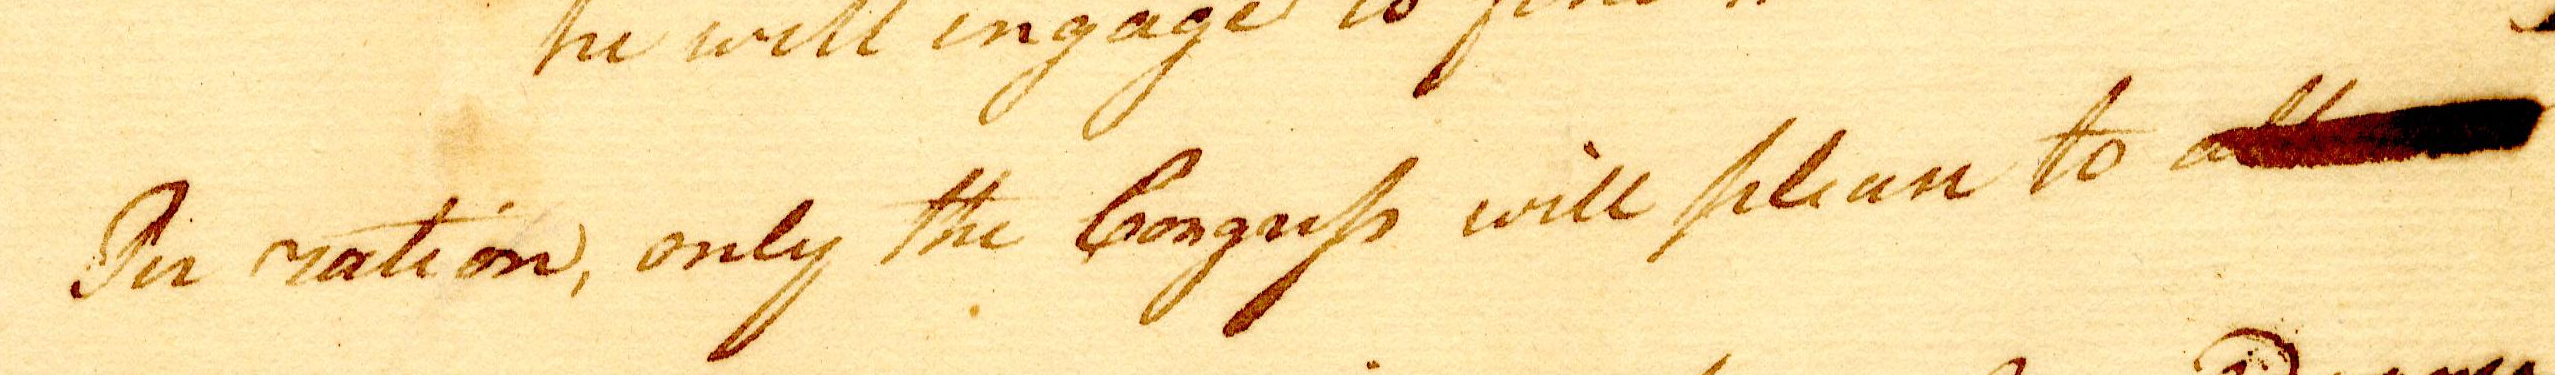Per ration, only the Congress will plan to allocate
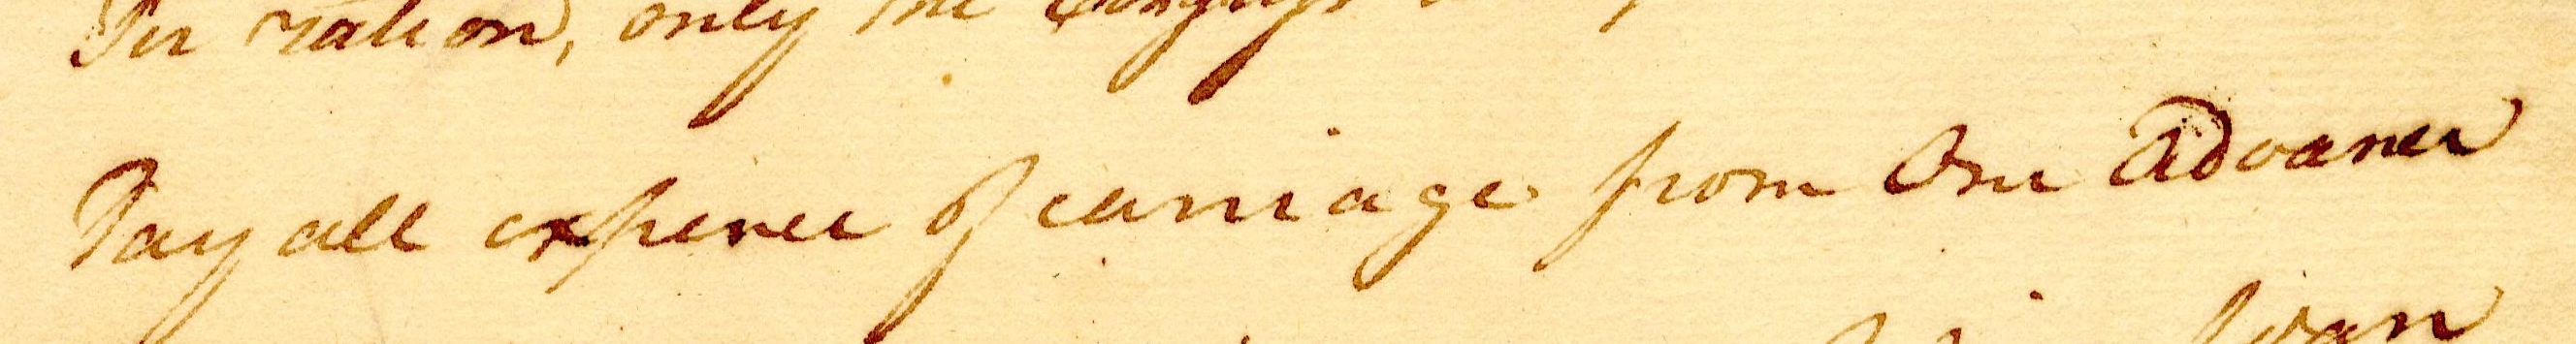Pay all expence of carriage from One Advance
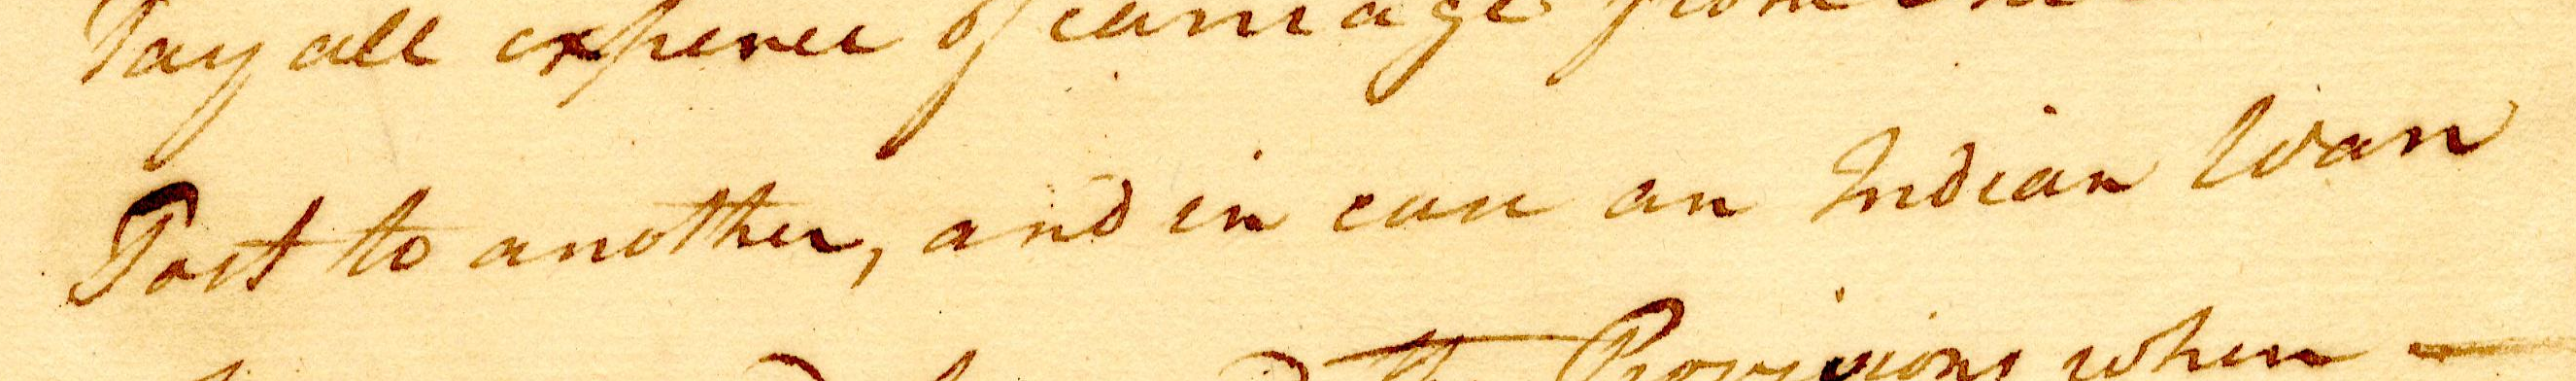Post to another, and in case an Indian war
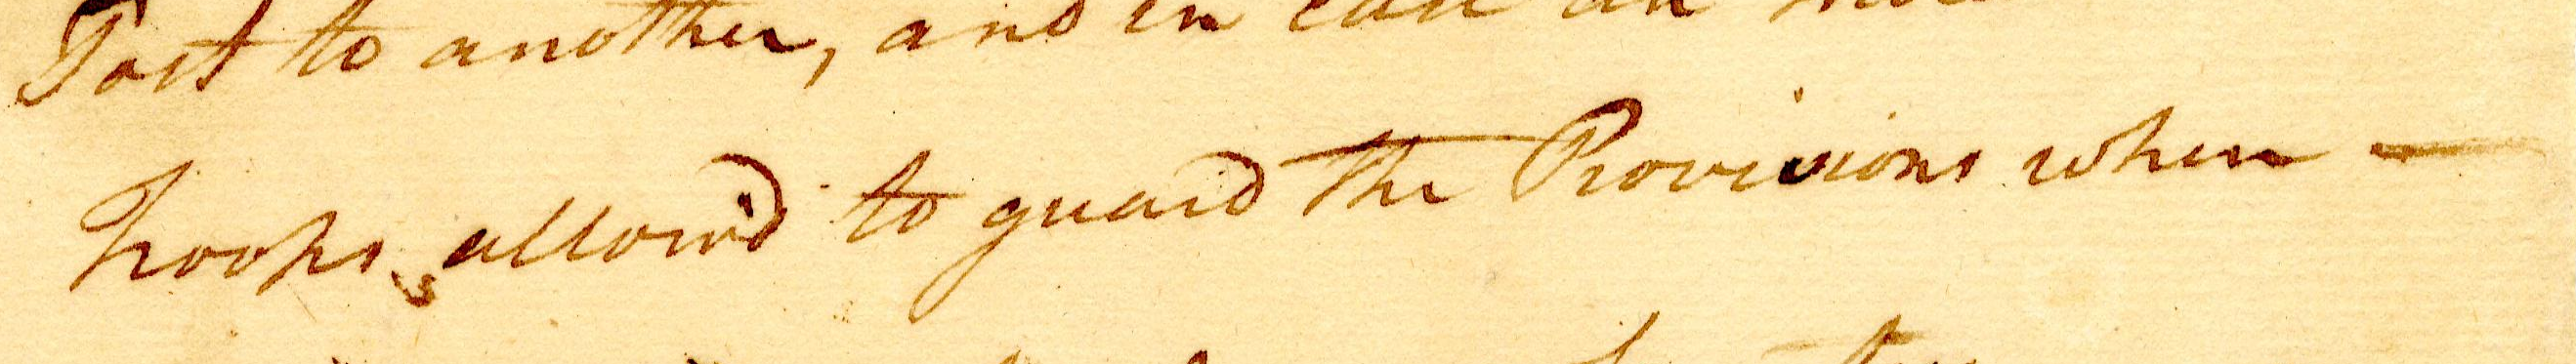Troops allow'd to guard the Provisions when-
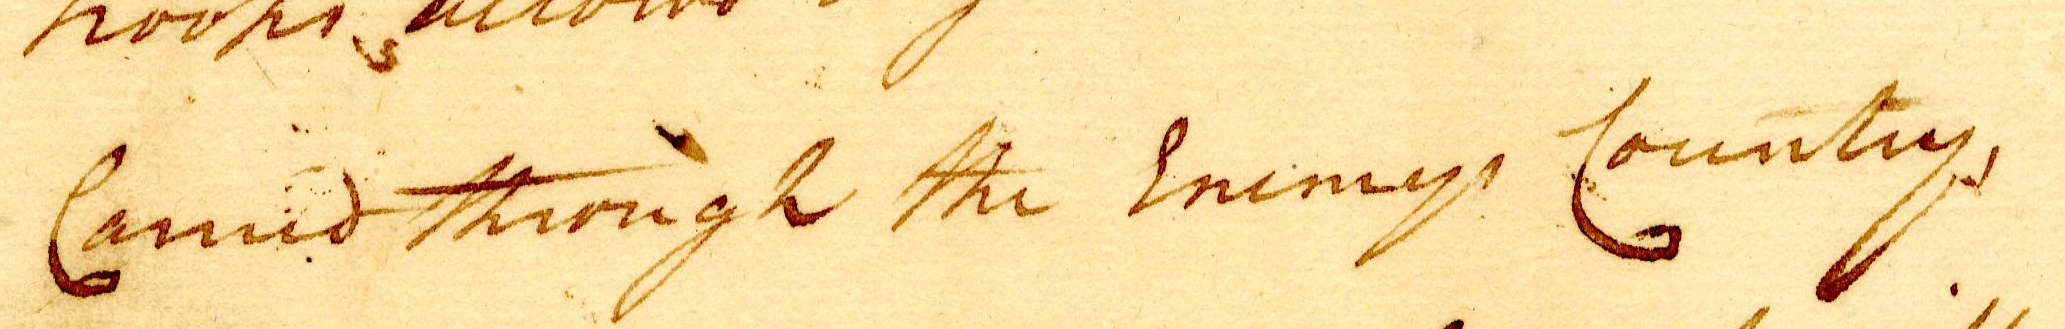Carried through the Enemys Countrys
